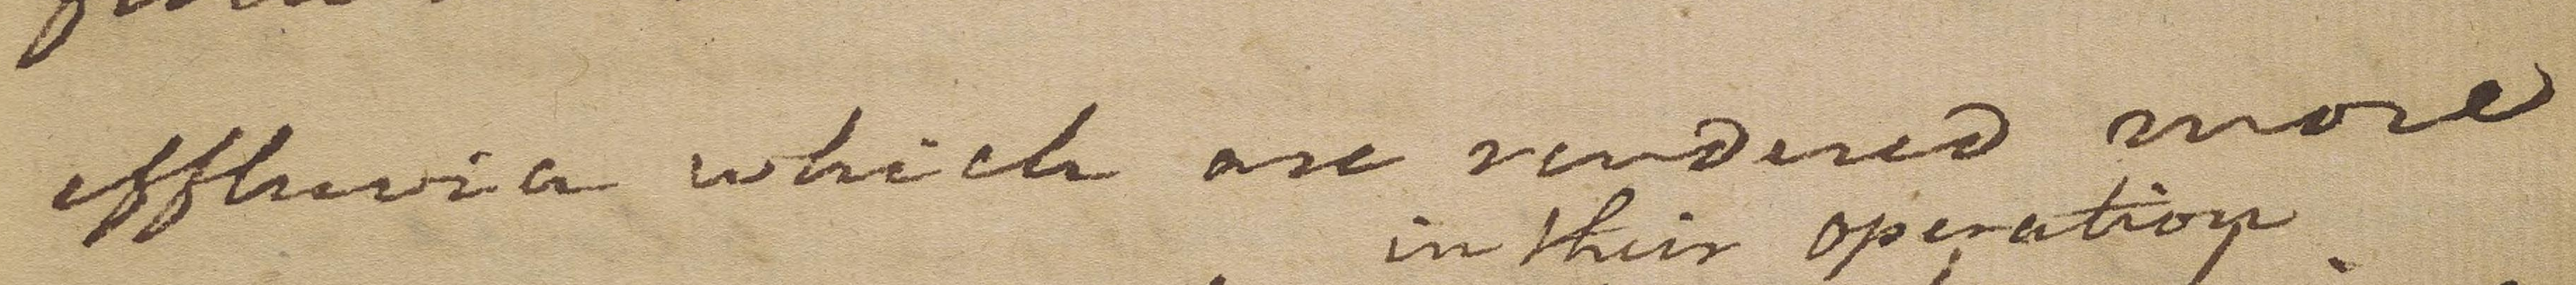effluvia which are rendered more
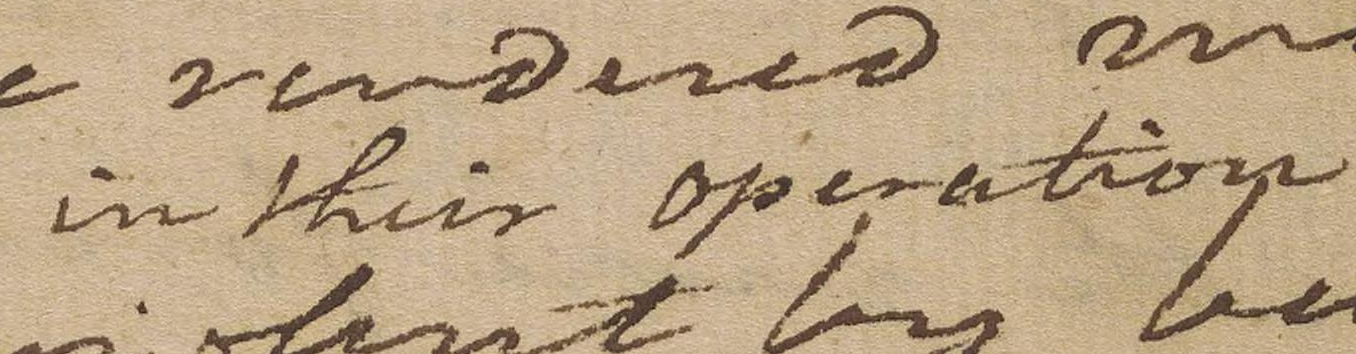in this operation
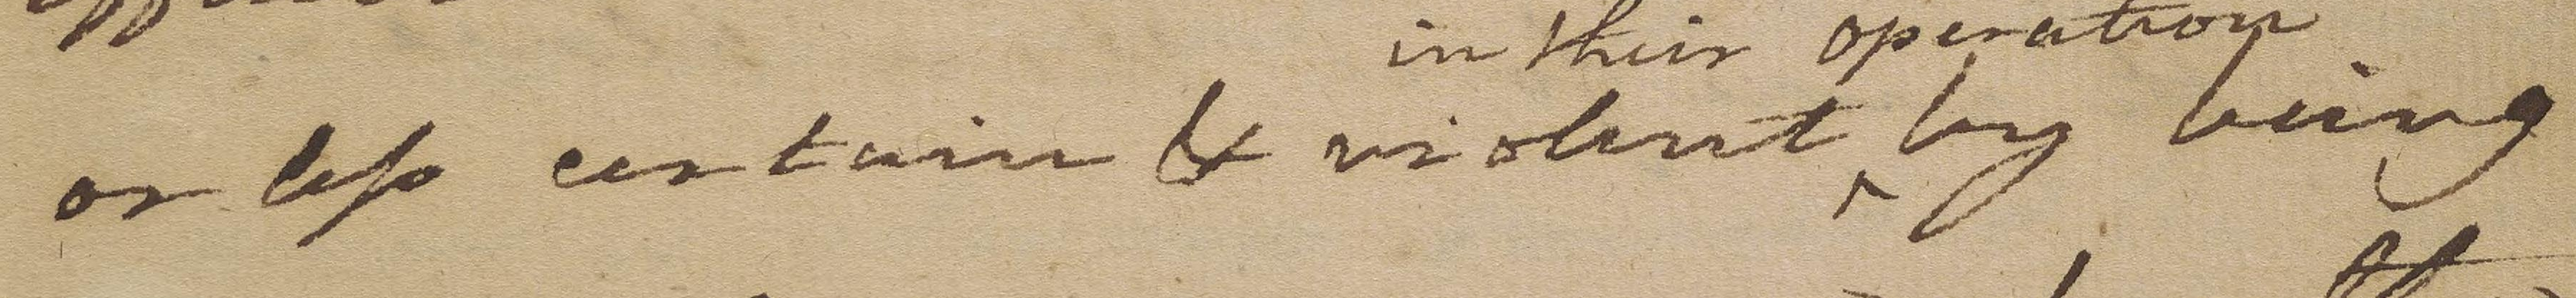or less certain & violent ^ by being
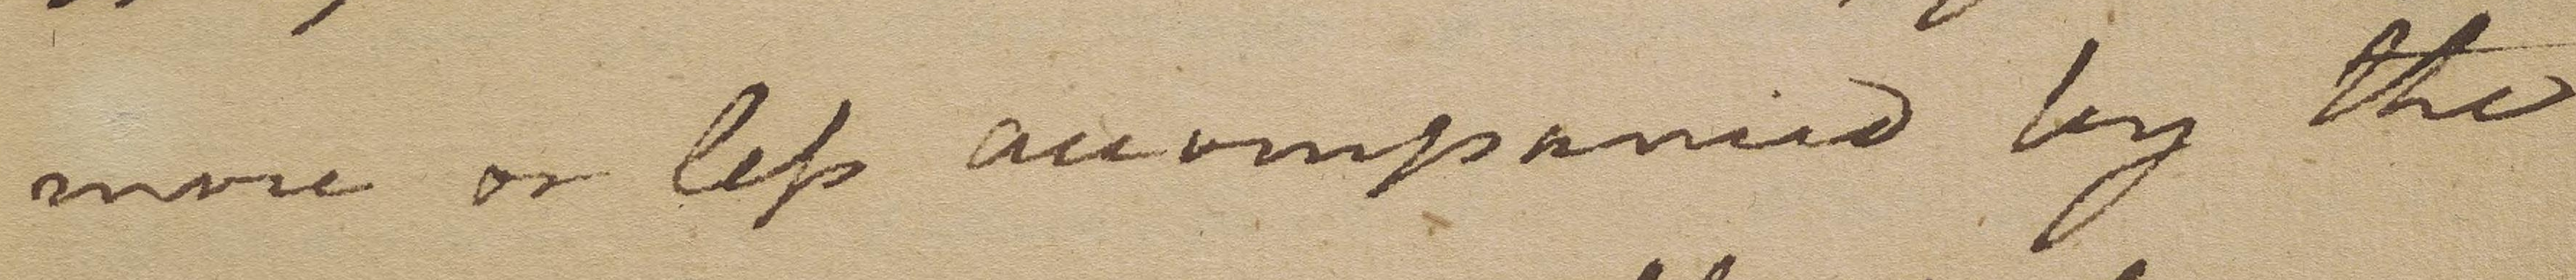more or less accompanied by the
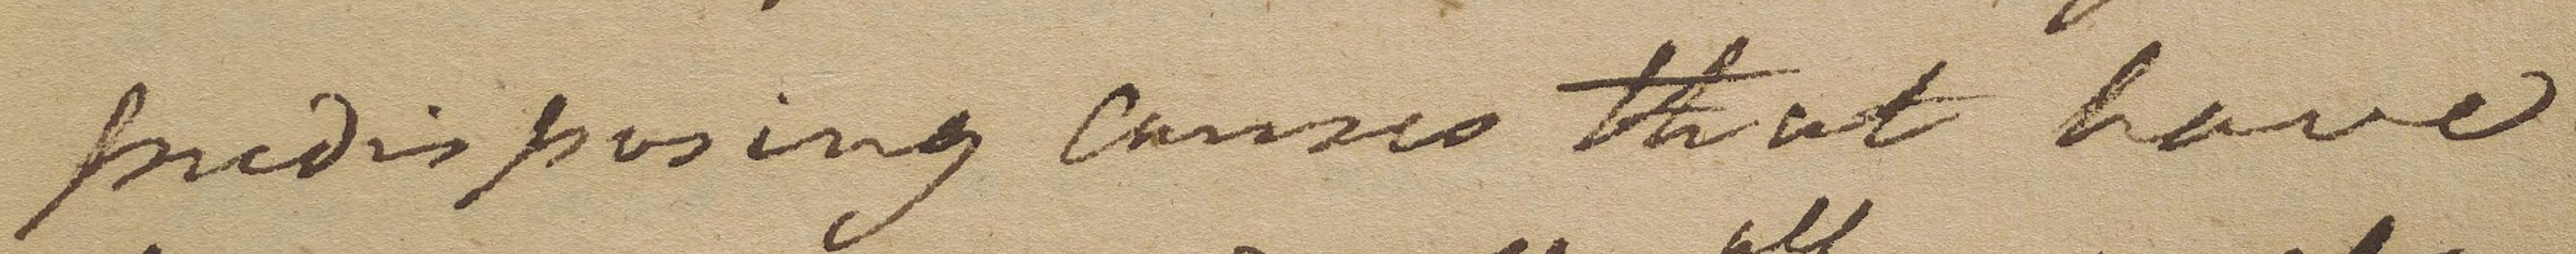predisposing causes that have
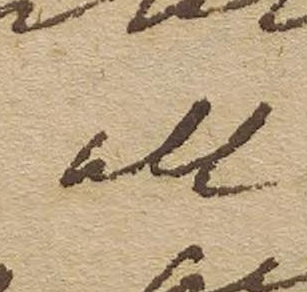all
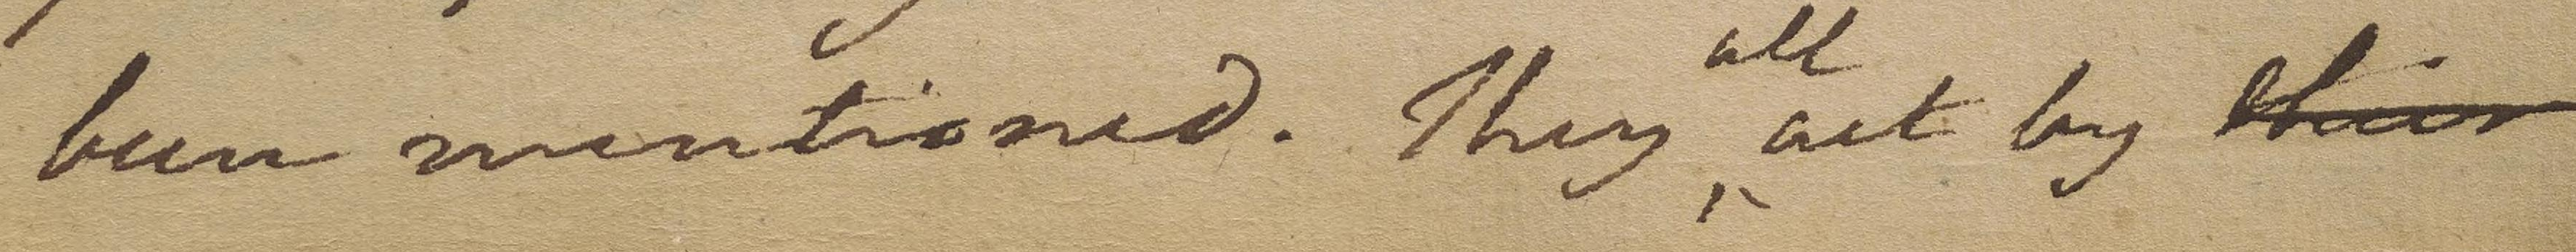been mentioned. They ^ act by
